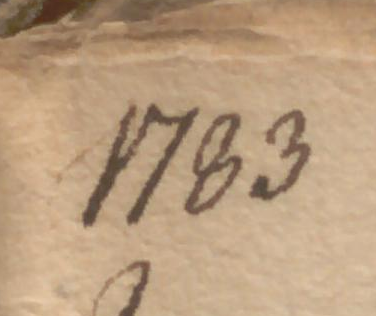1783
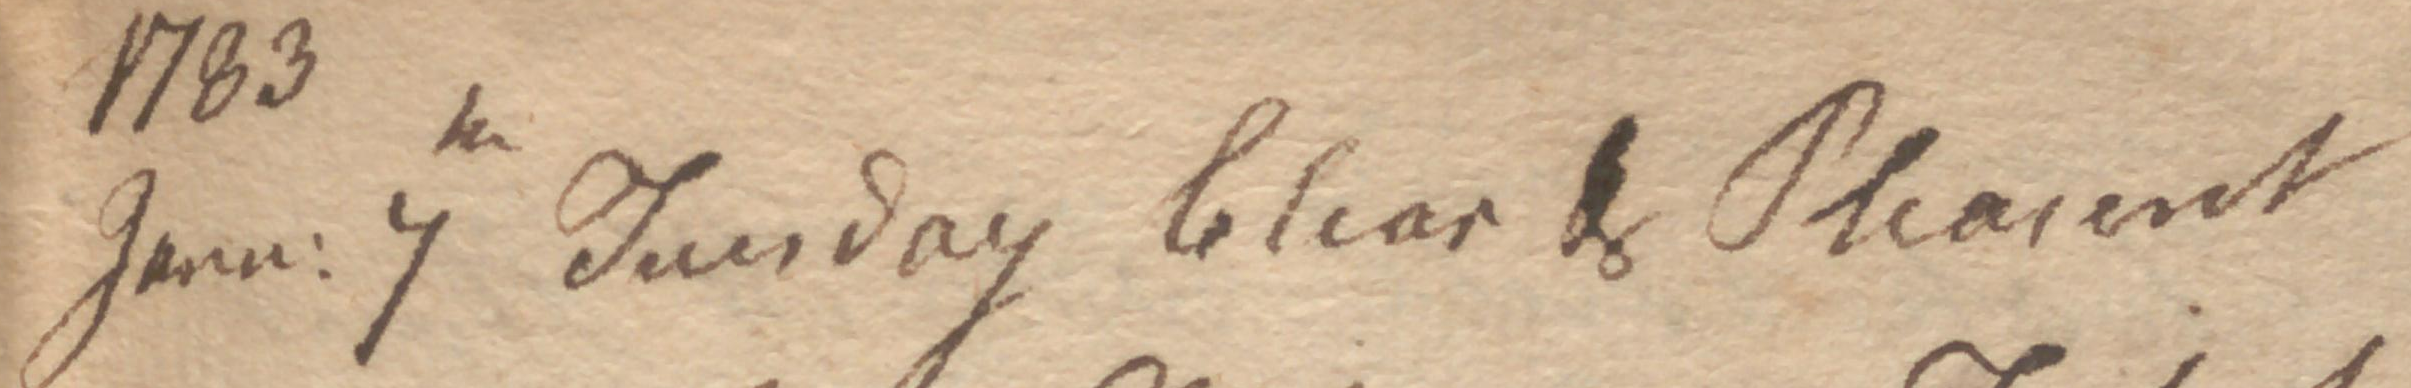Janu: 7^th Tuesday Clear & Pleasent
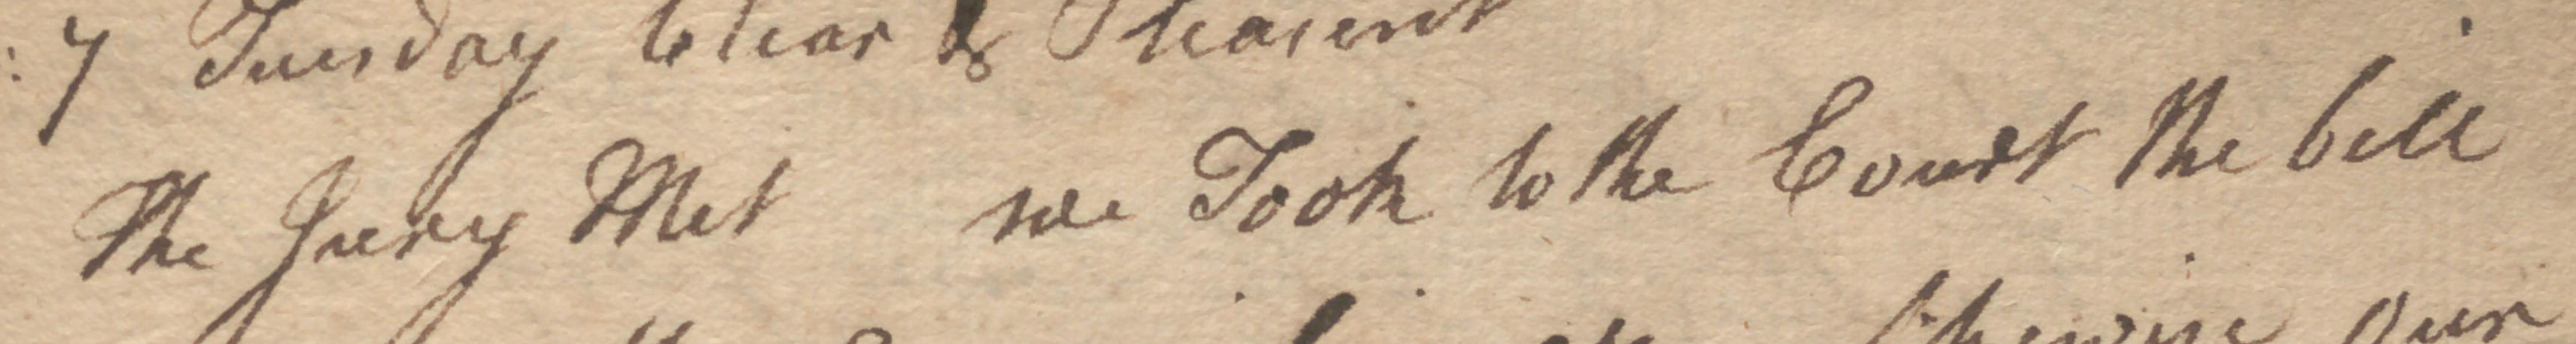The Jury Met we Took to the Court the bill
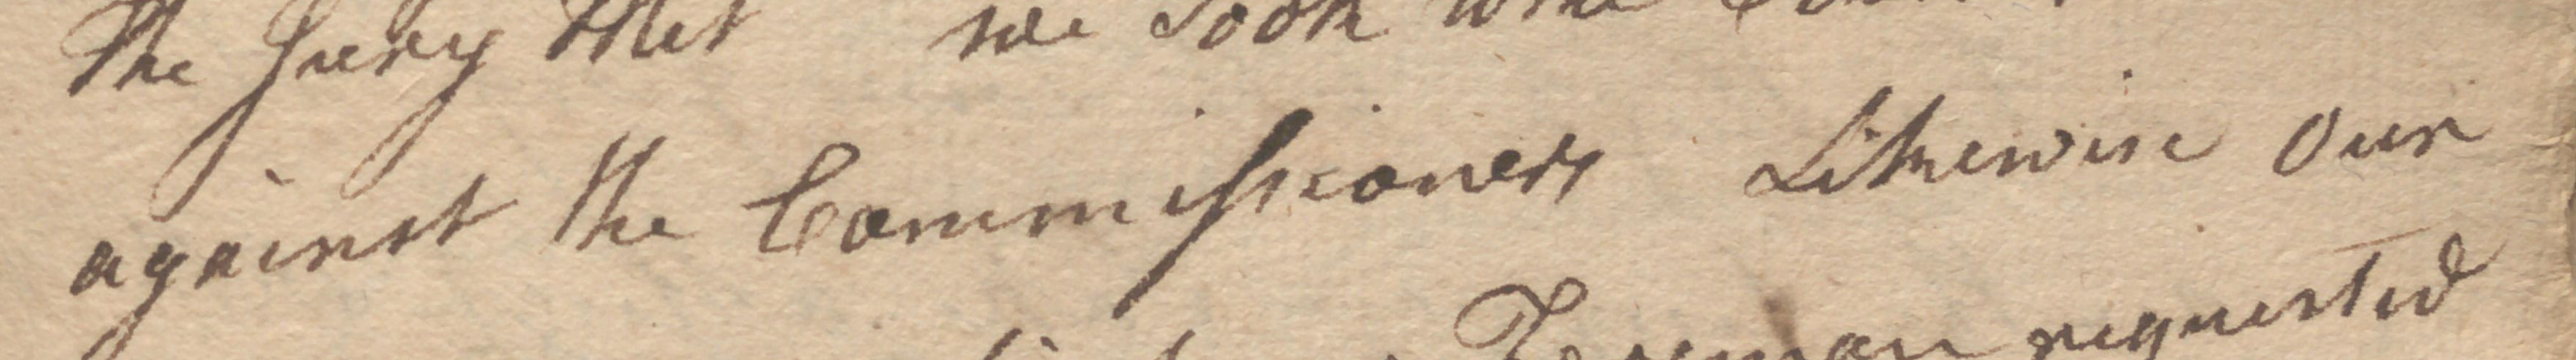against the Commissioners Likewise our
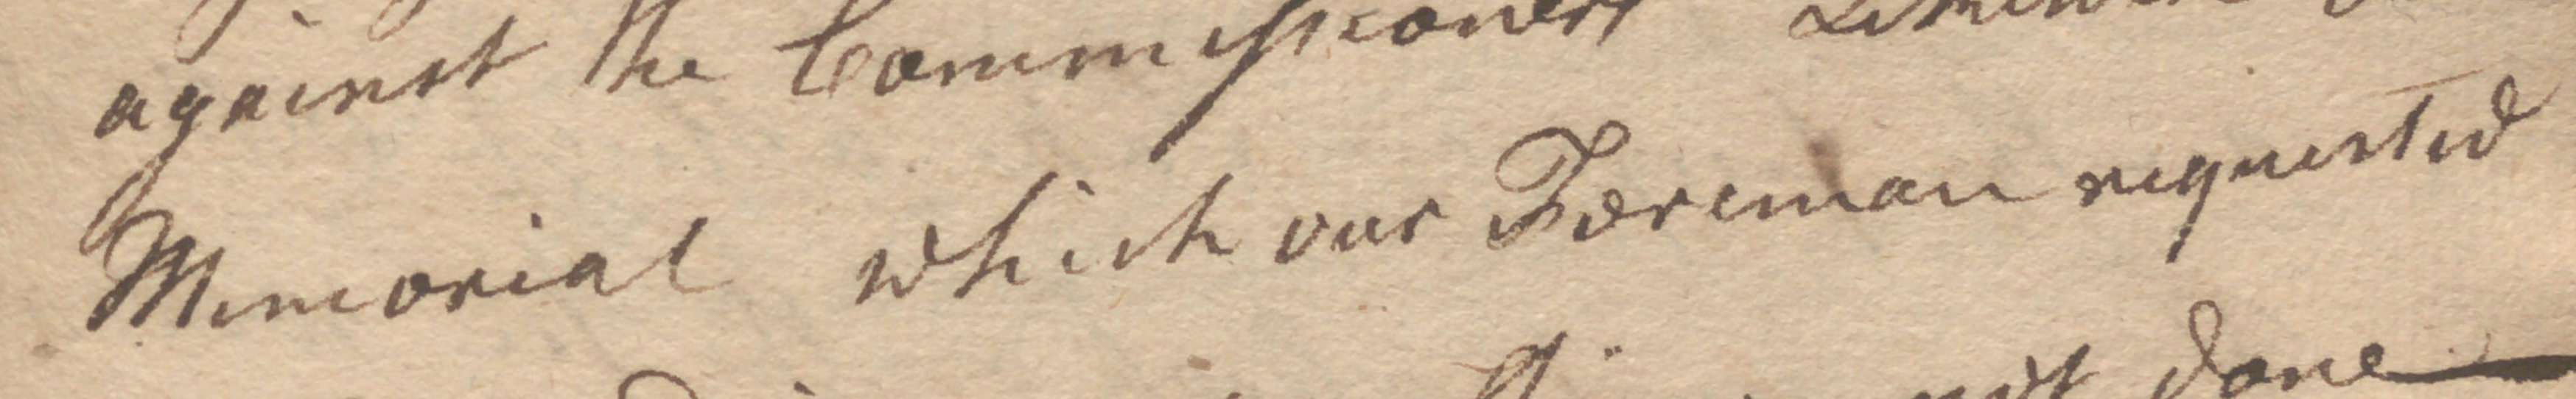Memorial which our Foreman requested
